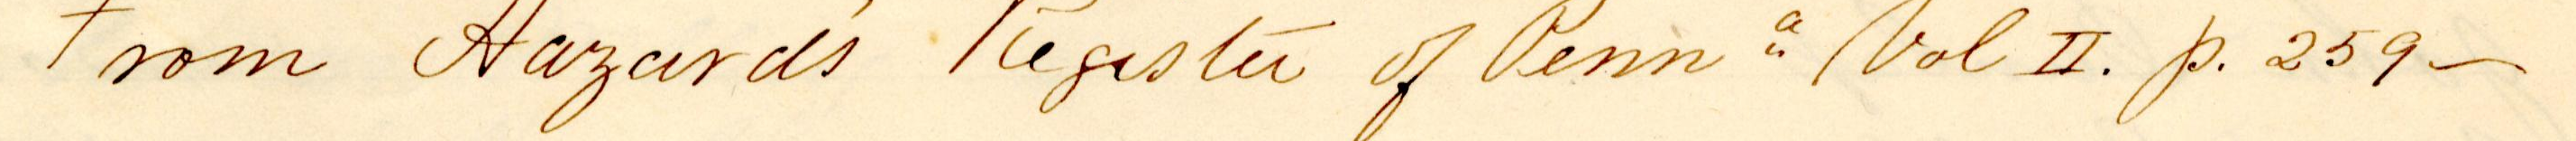"From Hazards Register of Penn^a. Vol II. p. 259-"
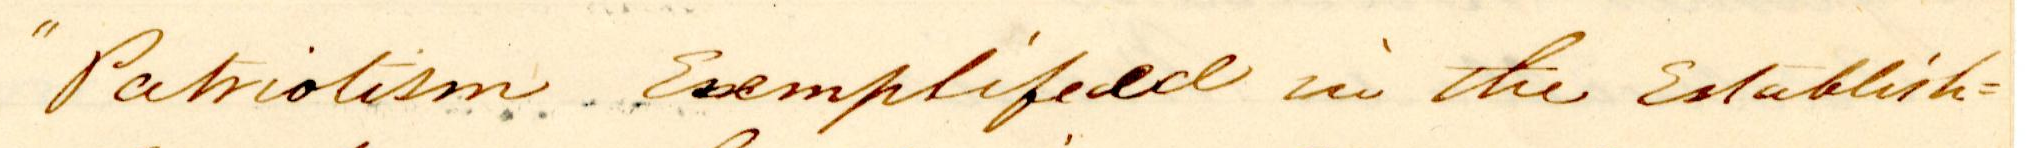"Patriotism. Exemplified in the Establish-
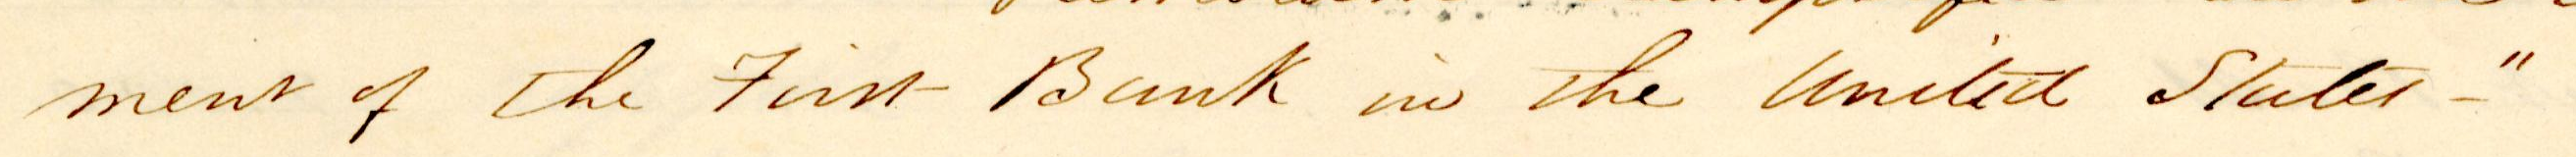-ment of the First Bank in the United States-"
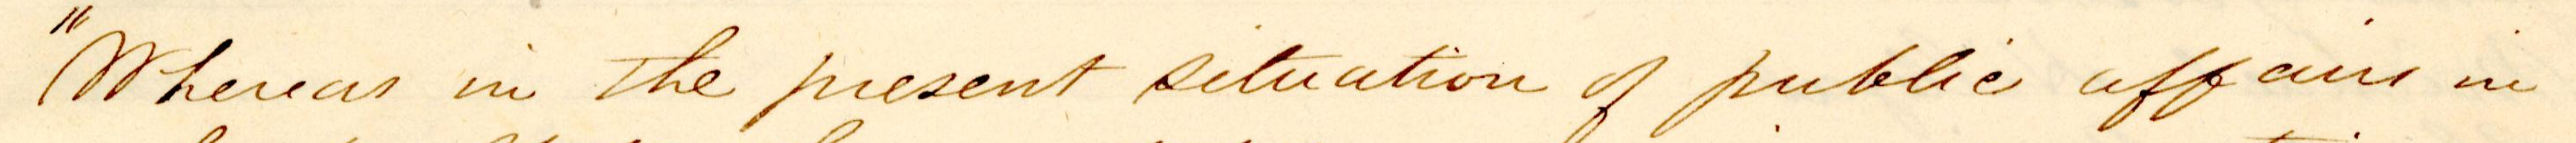"Whereas in the present situation of public affairs in
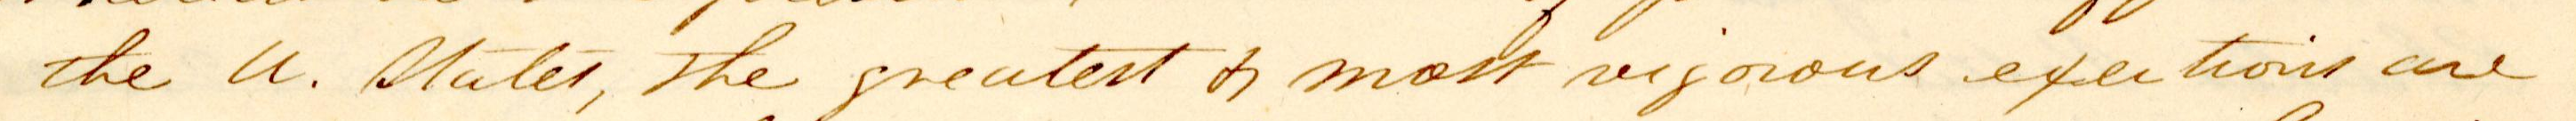the U. States, the greatest & most rigorous exertions are
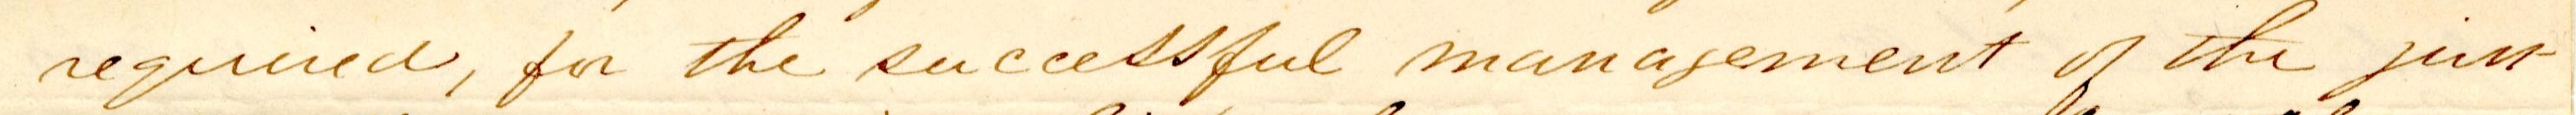required, for the successful management of the just
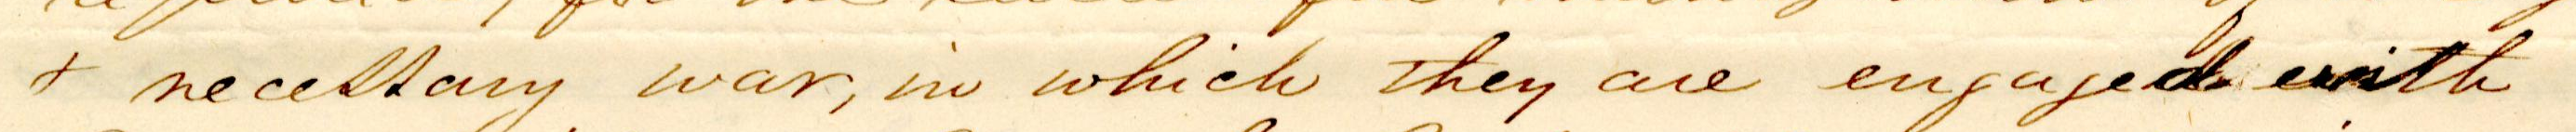& necessary war, in which they are engaged with
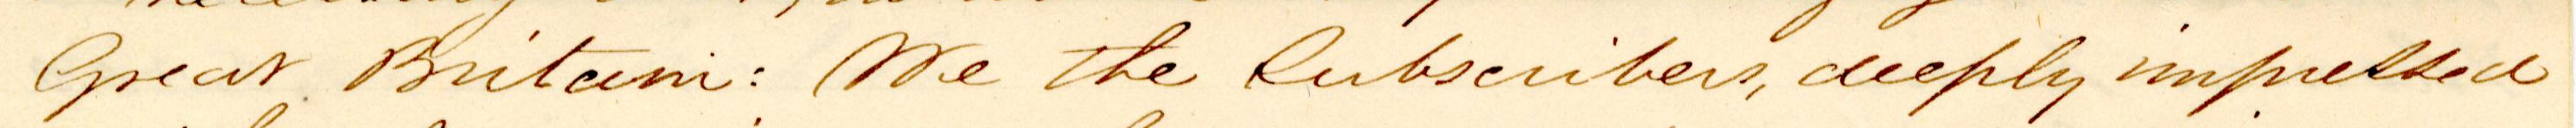Great Britain: We the Subscribers, deeply impressed
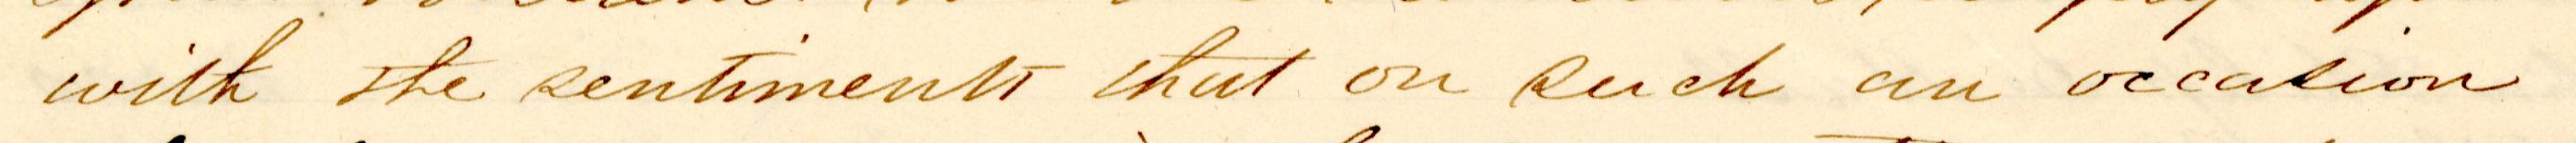with the sentiments that on such an occasion
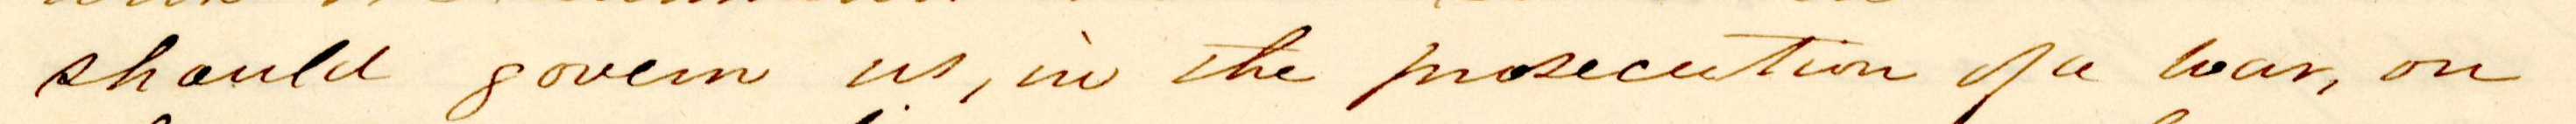should govern us, in the prosecution of a war, on
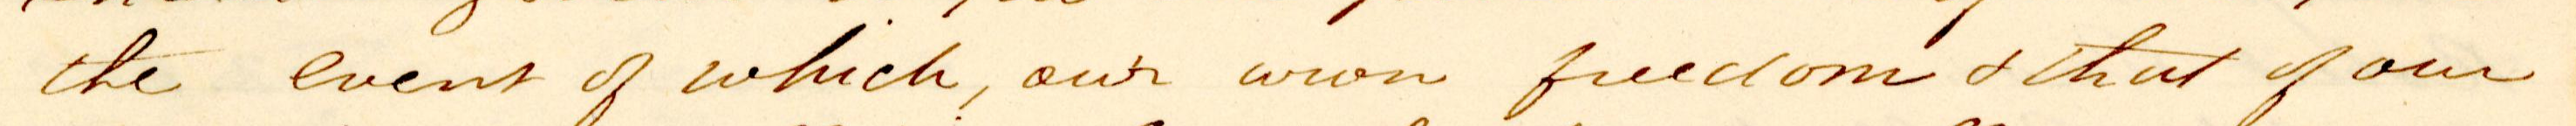the event of which, our won freedom & that of our
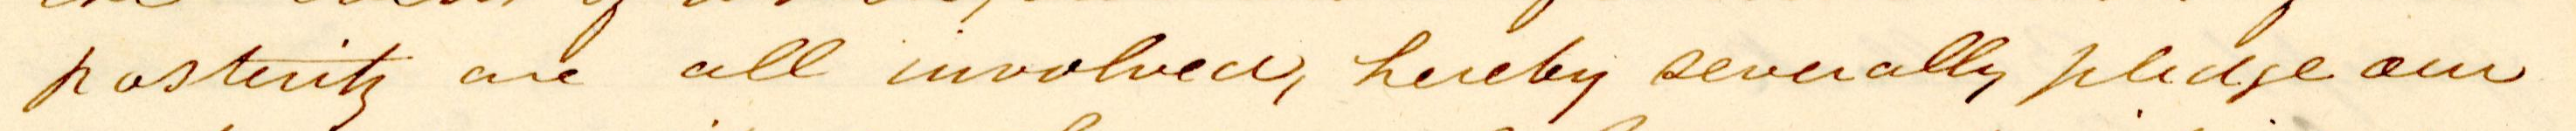posterity are all involved, hereby severally pledge our
